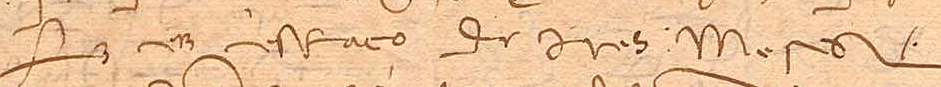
fez em espaço de tres Meses /.
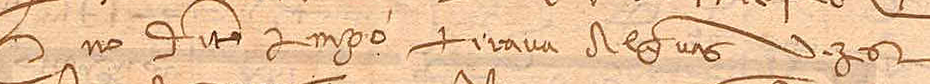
e no dito tempo tiraua Algūas vezes
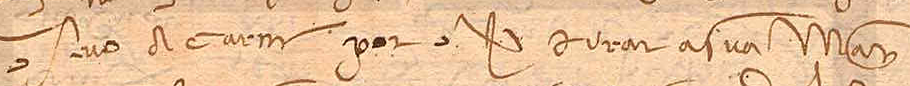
o seuo A carne por o ꝟ tirar a sua Mãy
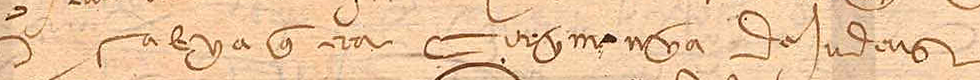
e sabya q̄ era Cirymonȳa de Judeus
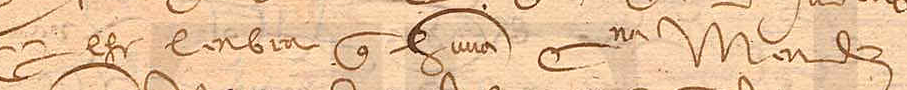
E lhe lenbra q̄ hūua Cna Mendez
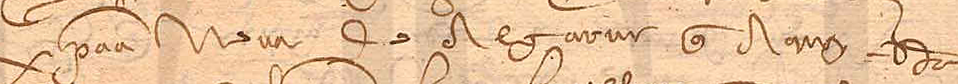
xp̄aa Noua do Algarue q̄ Aquy esta
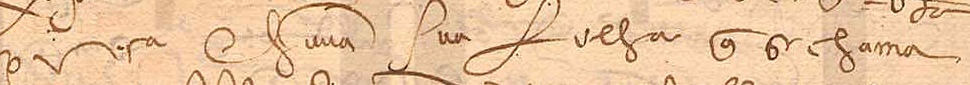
presa e hūua sua filha q̄ se chama
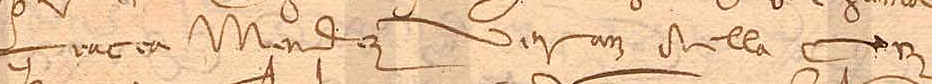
gracea Mendez viram A ella com
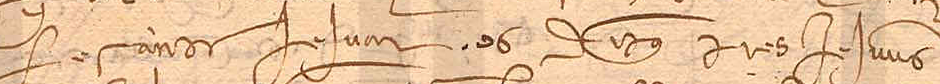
fesante JeJuar os ditꝯ tres JeJūus
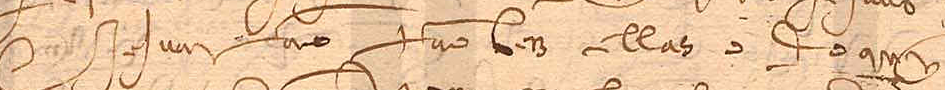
e Jejuarão tãobem ellas o do quy
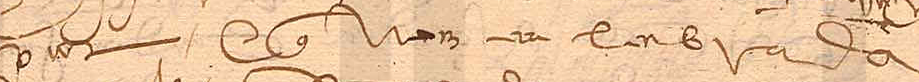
pur / e q̄ nom era lenbrada
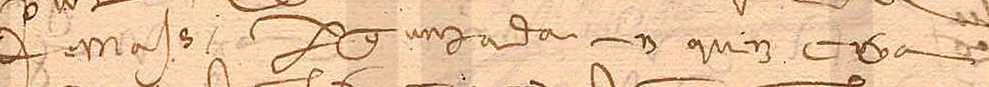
de maJs / ꝑguntada em quem crya
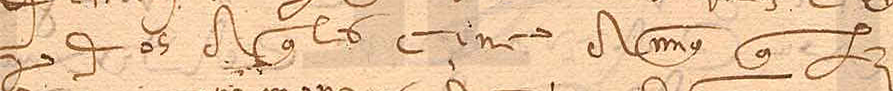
todos Aq̄les cinco Annꝯ q̄ fez
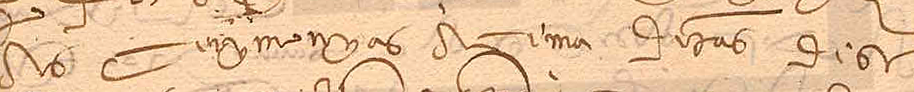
As Cerymonyas Acima ditas dise
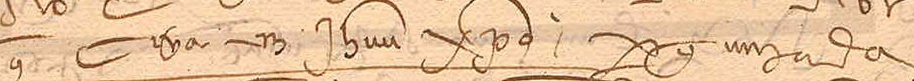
q̄ crya em Jhuu xp̄o / ꝑguntada
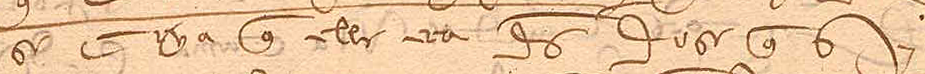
se crya q̄ elle era d̄s dise q̄ sy
